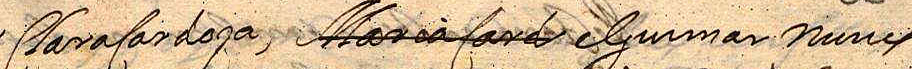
Clara Cardoza, Maria Card e Guimar Nunes
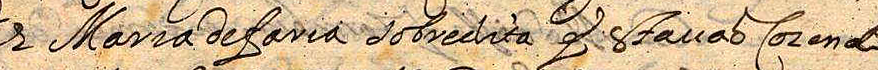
E Maria de faria sobredita q̄ estauaõ Cozendo
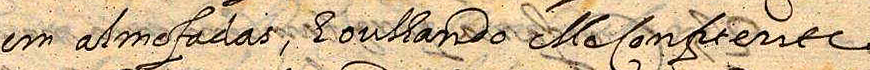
em Almofadas, E oulhando elle Confitente
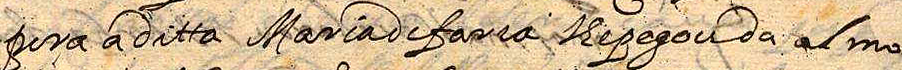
pera a ditta Maria de faria lhe pegou da almo
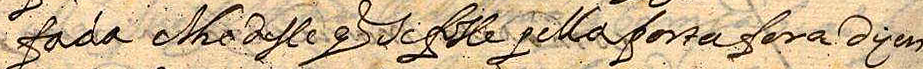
fada e lhe disse q̄ se fosse pella porta fora dizen
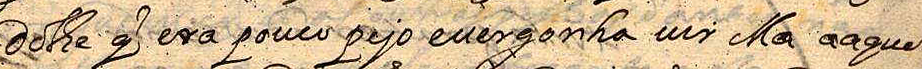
dolhe q̄ era pouco pejo e uergonha uir ella aaquel
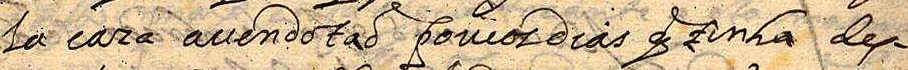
la caza auendo taõ poucos dias q̄ tinha des
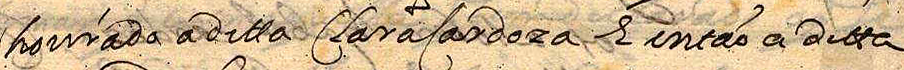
honrádo a ditta Clara Cardoza E entaõ a ditta
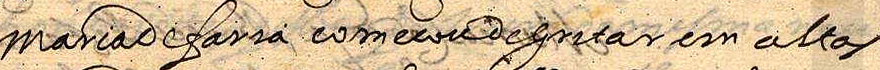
maria de faria comecou de gritar em altas
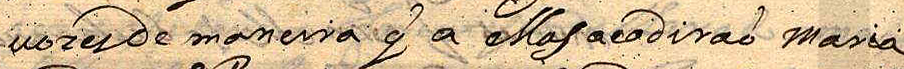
uozes de maneira q̄ a ellas acodiraõ maria
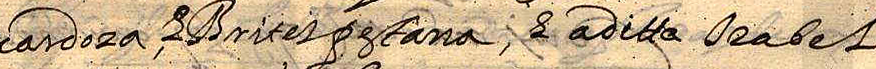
cardoza, E Brites pestana, E a ditta IzabeL
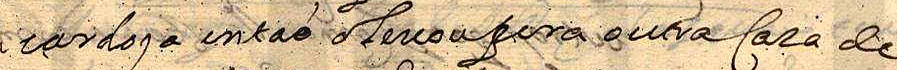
cardoza entaõ o leuou pera outra Caza de
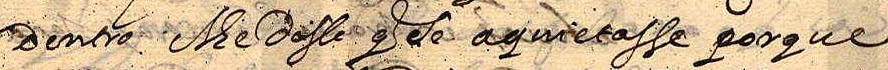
dentro e lhe disse q̄ se aquietasse porque
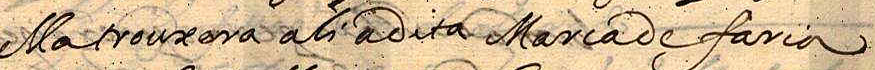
ella trouxera ali a dita Maria de faria
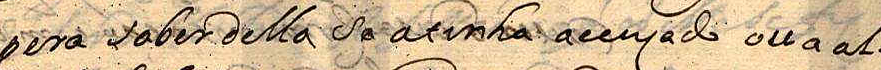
pera saber della se a tinha accuzado ou a al
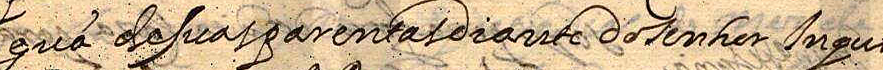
guā de suas parentas diante do senhor Inqui
